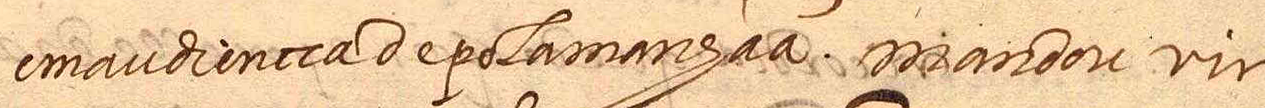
em audiencia de pola manhaā mandou vir
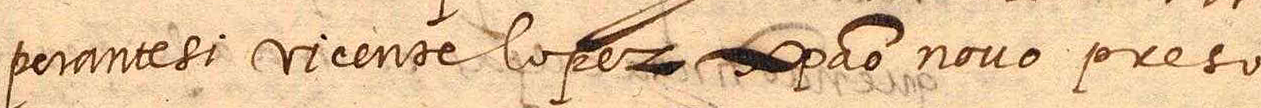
perante si vicente lopez xpaõ nouo preso
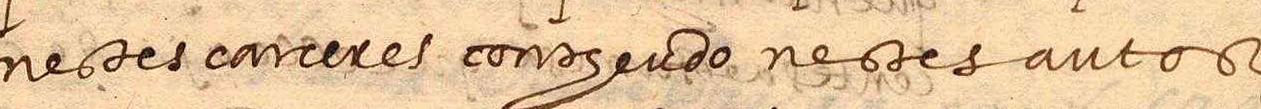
nestes carceres contheudo nestes autos
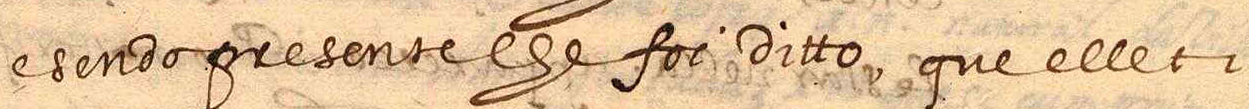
e sendo presente lhe foi ditto que elle ti
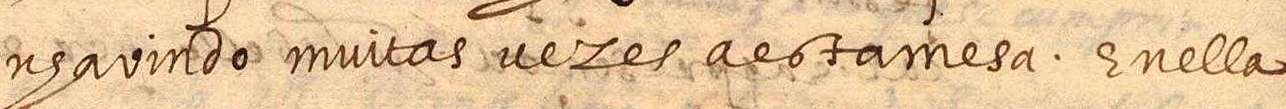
nha vindo muitas uezes a esta mesa . E nella
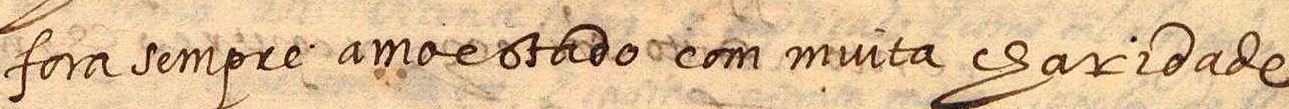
fora sempre amoestado com muita charidade
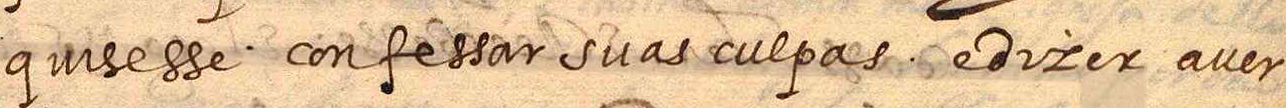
quisesse confessar suas culpas . e dizer a uer
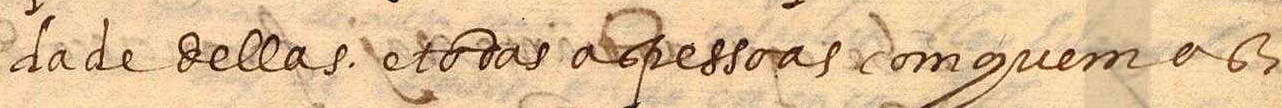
dade dellas . e todas as pessoas com quem as
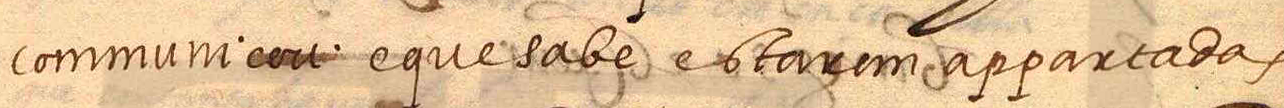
communicou . e que sabe estarem appartadas
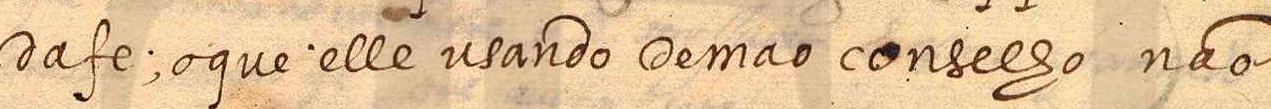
da fe; o que elle usando de mao conselho naõ
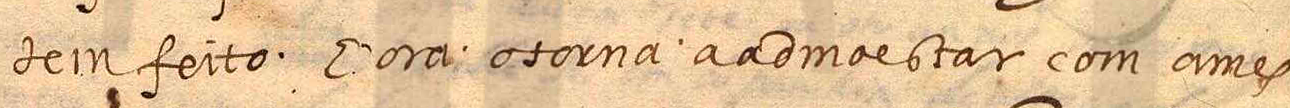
tem feito . E ora o torna a admoestar com a mes
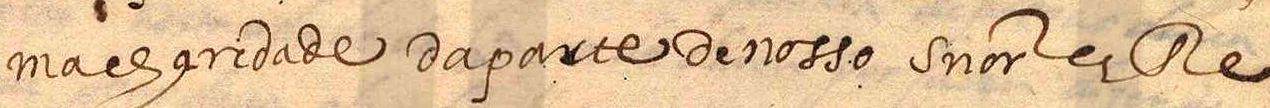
ma charidade da parte de nosso Snōr e Re
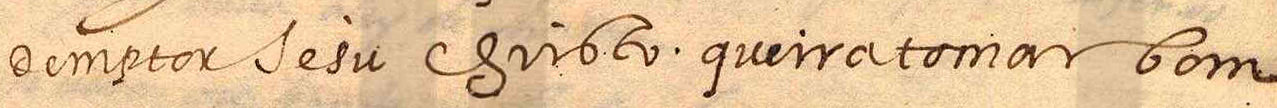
demptor Iesu christo queira tomar bom
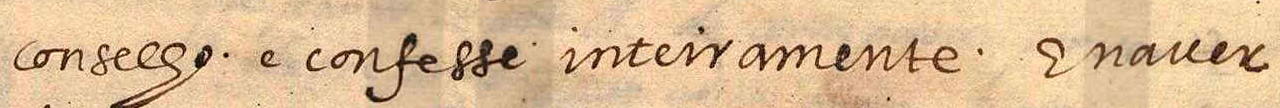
conselho e confesse inteiramente . E na uer
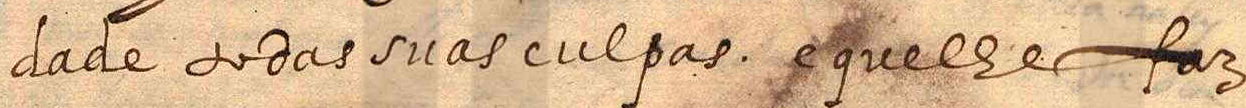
dade todas suas culpas . e que lhe faz
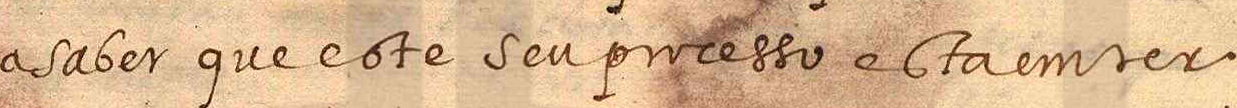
a saber que este seu processo esta em ter
